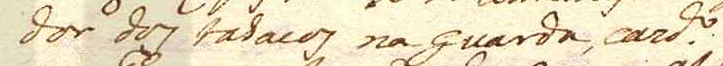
dor dos tabacos na Guarda, cazd.o
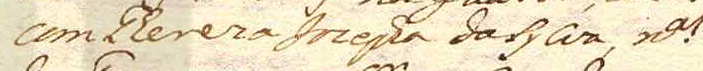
com Thereza Jozepha da Sylva, n.al
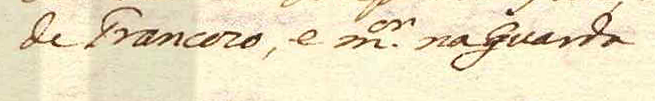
de Trancozo, e m.or na Guarda
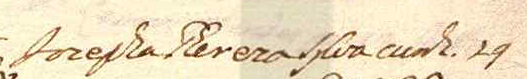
Jozepha Thereza Sylva cunh. 19
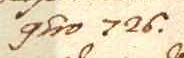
9bro 726.
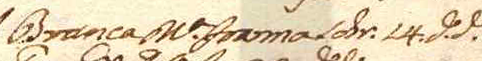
Branca M.a Joana sobr. 14 d.o d.o
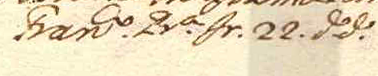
Franco Pr.a Jr. 22. d.o d.o
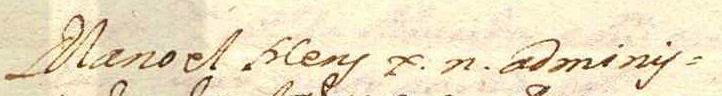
Manoel Hens x. n. adminis
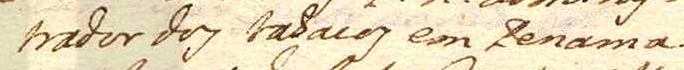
trador dos tabacos em Penama
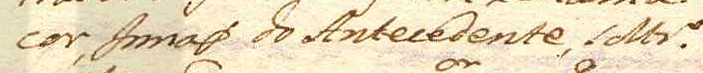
cor Jrmaõ do Antecedente, soltr.o
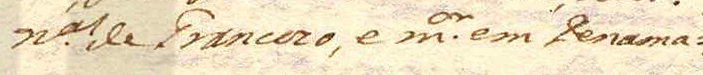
n.al de Trancozo, e m.or em Penama
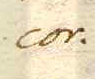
cor.
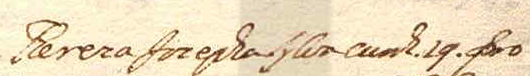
Thereza Jozepha sylva cunh. 19. 9bro
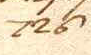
726
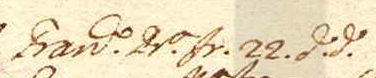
Fran.co Pr.a Jr. 22. d.o d.o
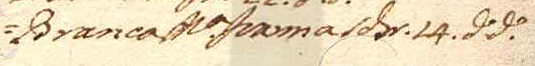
Branca M.a Joanna sobr. 14. d.o d.o
